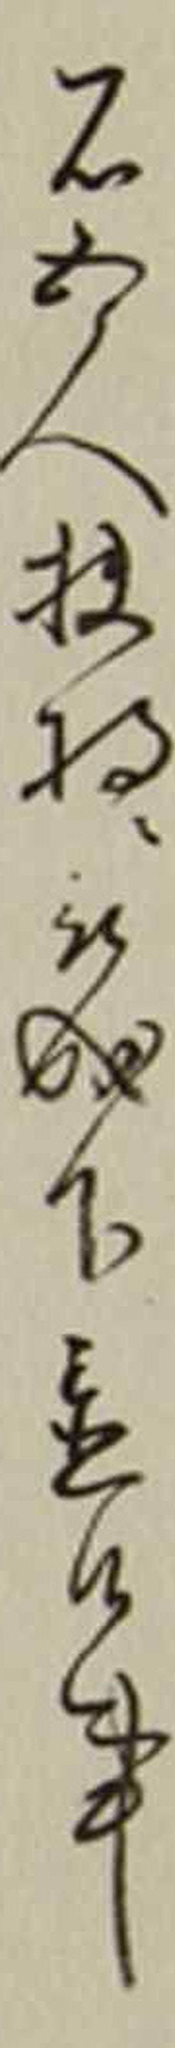石五人扶持ニ被成下置候事
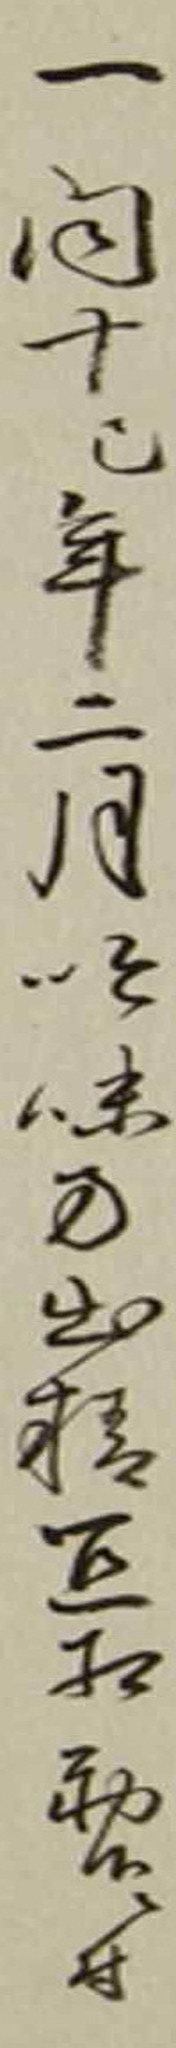一同十巳年二月吟味方出精宜相勤候ニ付
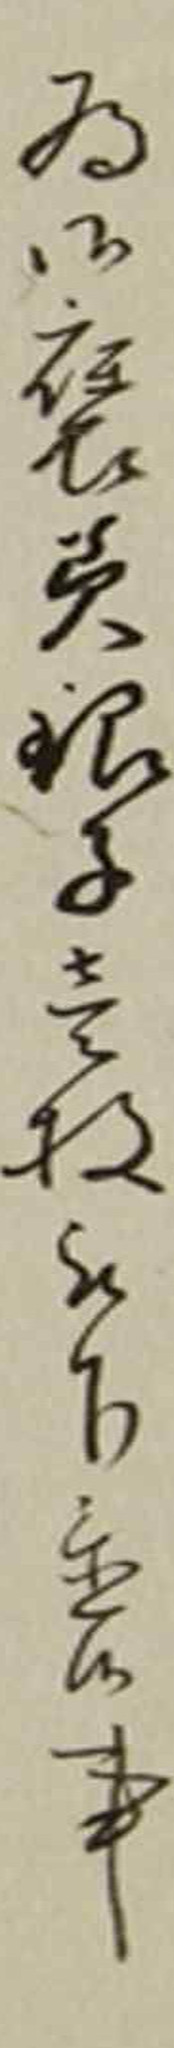為御褒美銀子壱枚被下置候事
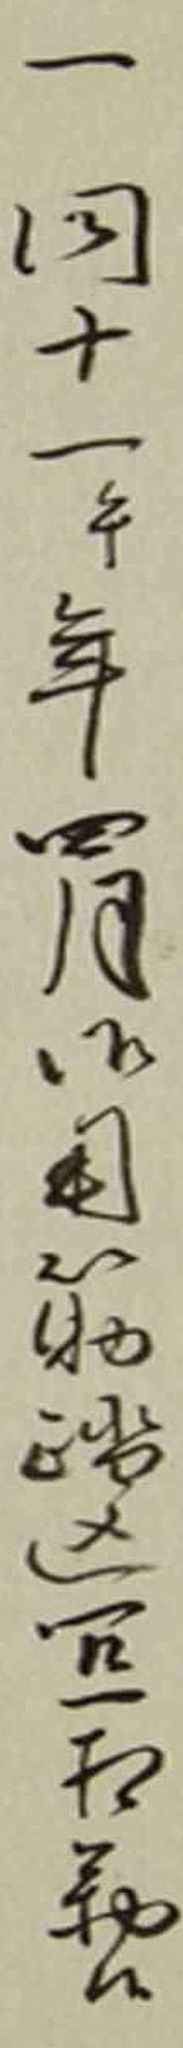一同十一午年四月御用筋踏込宜相勤候
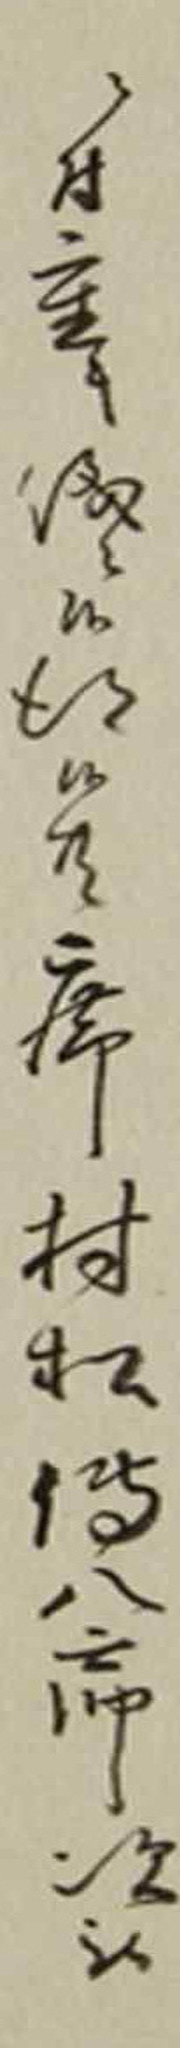ニ付重キ儀ニ候得候共席村松伝八郎次被
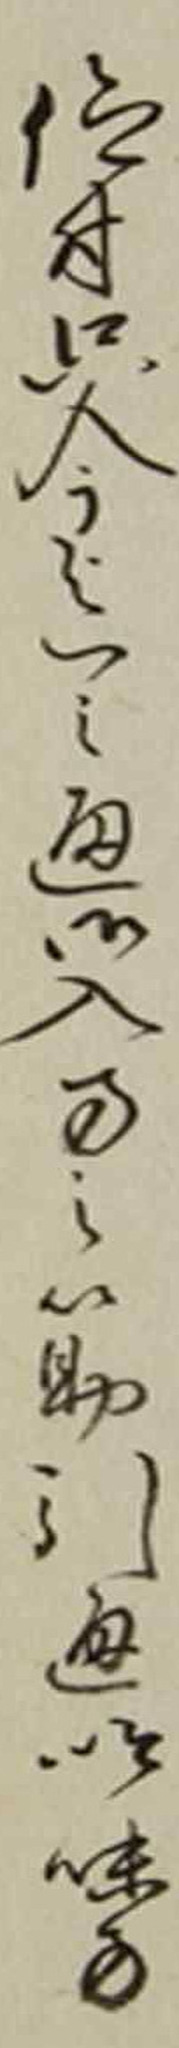仰付只今迄之通御入方之筋引通吟味方
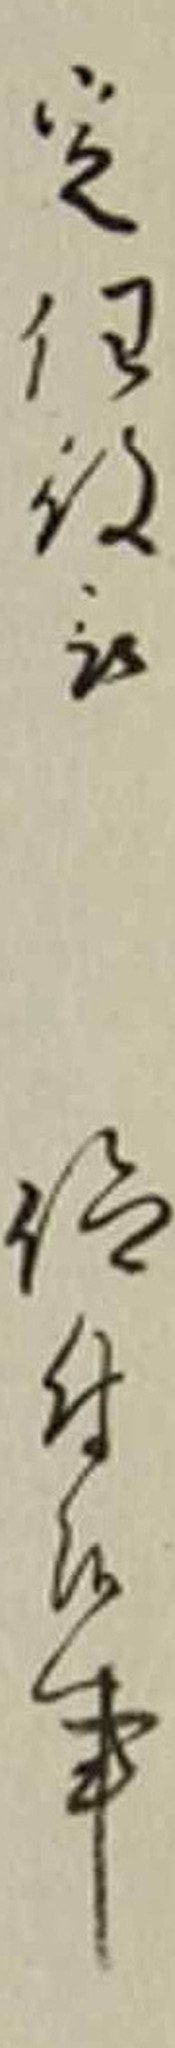定任役被仰付候事
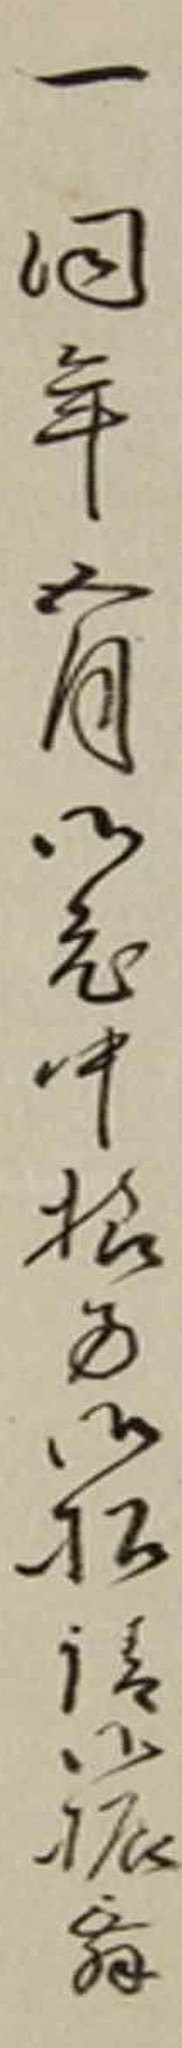一同年五月御老中様方御招請御振舞
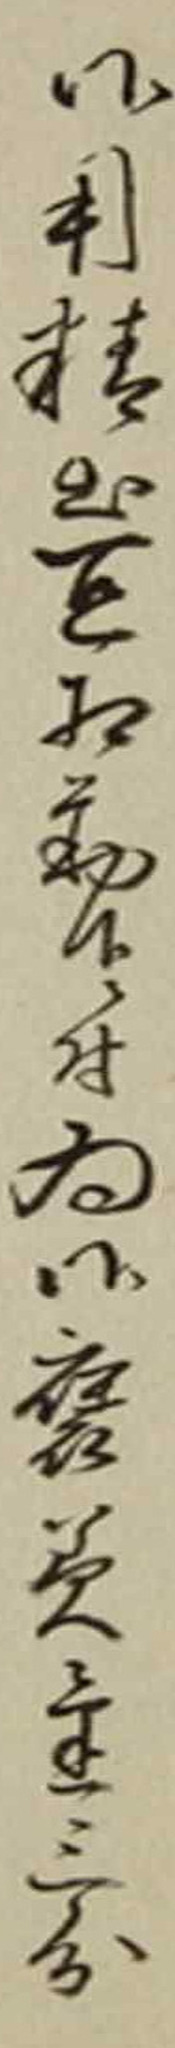御用精出宜相勤候ニ付為御褒美金三分
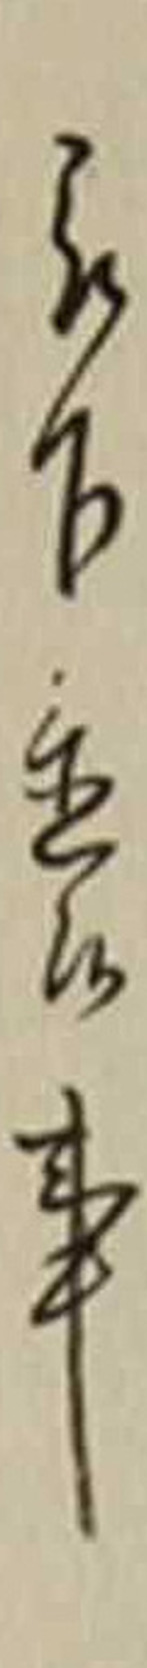被下置候事
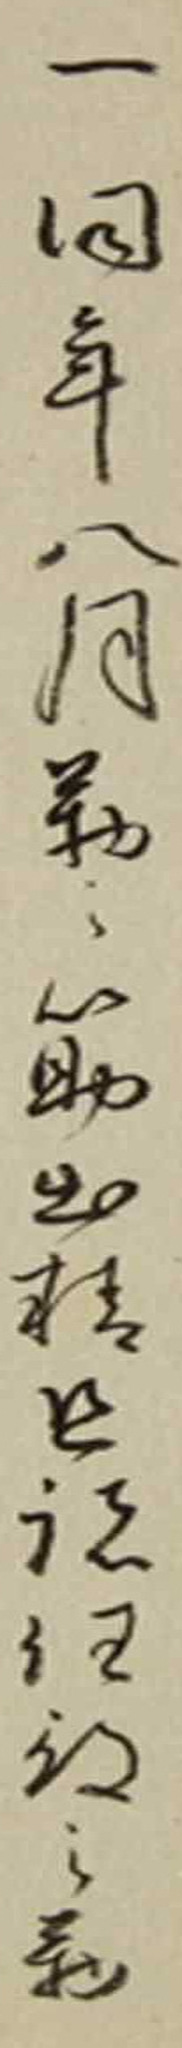一同年八月勤之筋出精且諸任役之勤
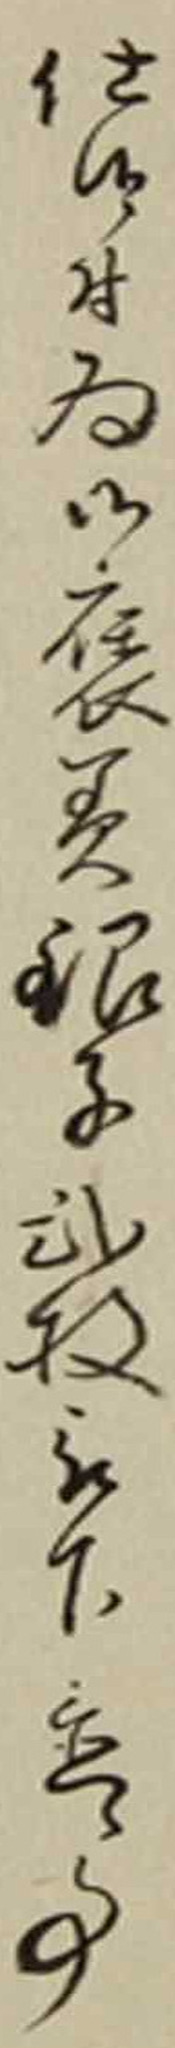仕候ニ付為御褒美銀子弐枚被下置候事
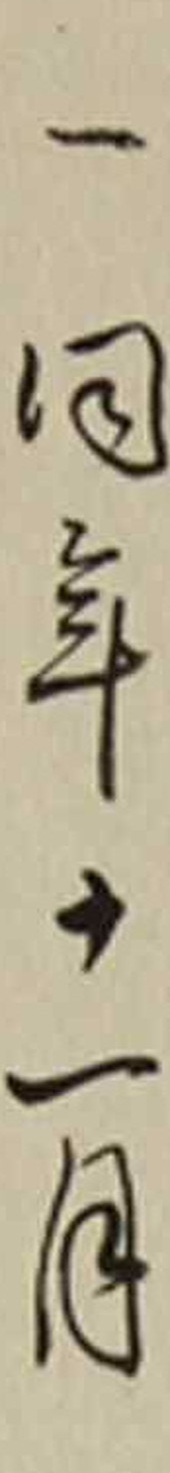一同年十一月
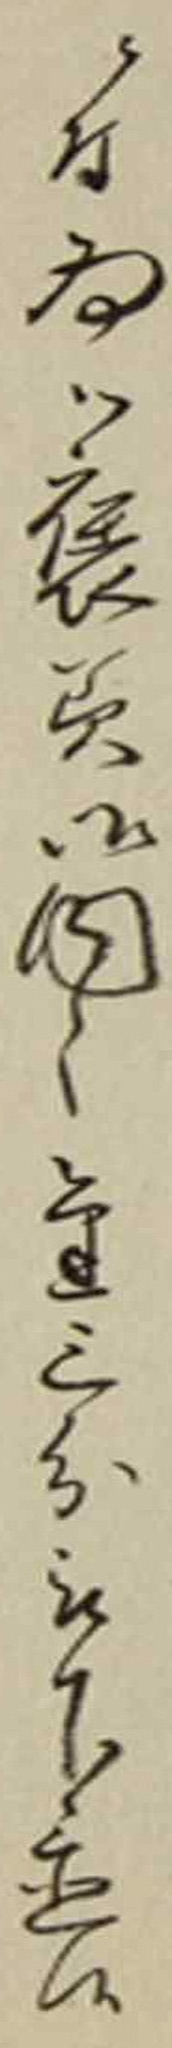ニ付為御褒美御内々金三分被下置候
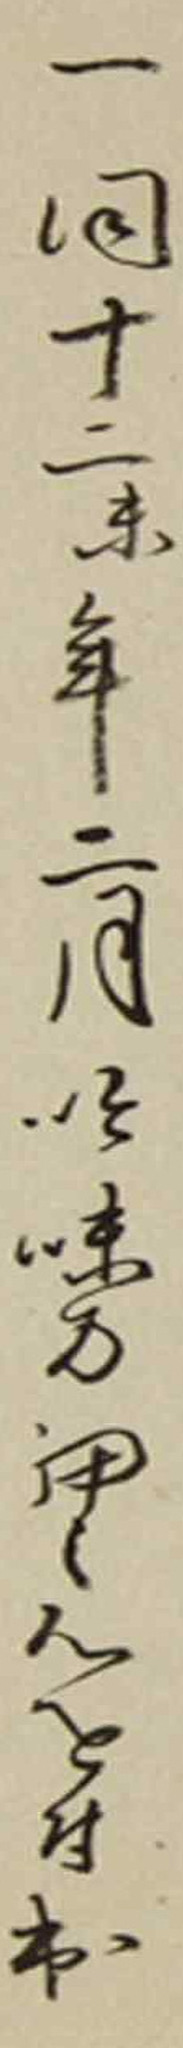一同十二未年二月吟味方細々心を付出
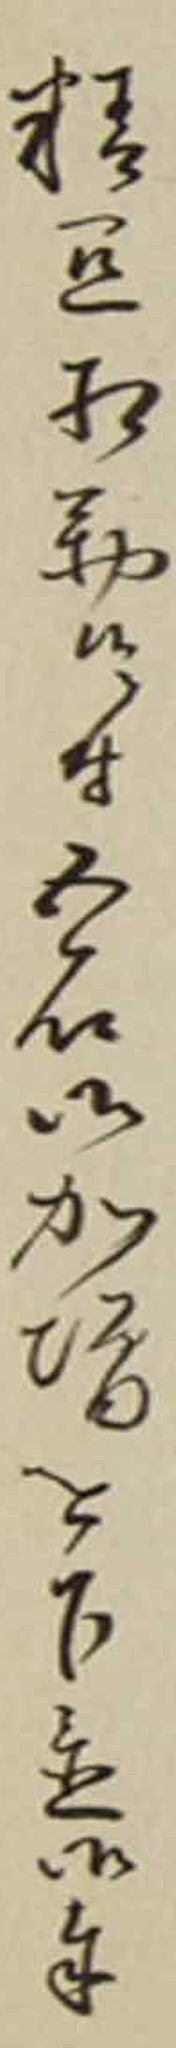精宜相勤候ニ付五石御加増を下置御奉
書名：諸士系譜　巻之4　い之部4
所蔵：会津若松市立会津図書館
